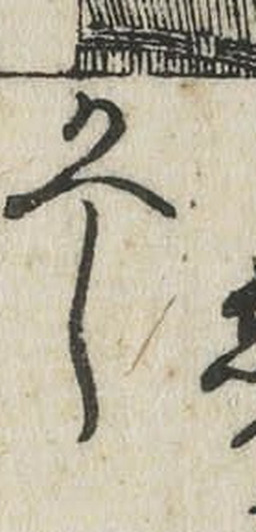かへし
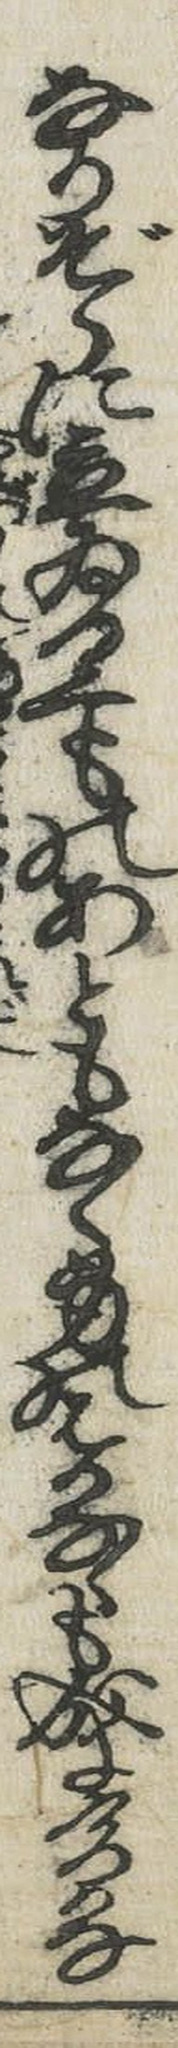なかぞらに立ゐるくものあともなく身のはかなくも成にけるかな
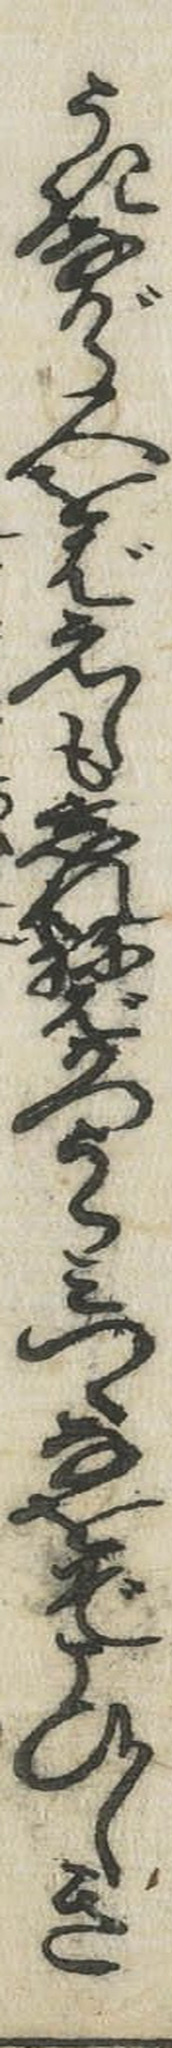うきながら人をばえしも忘れねばかつうらみつゝなをぞこひしき
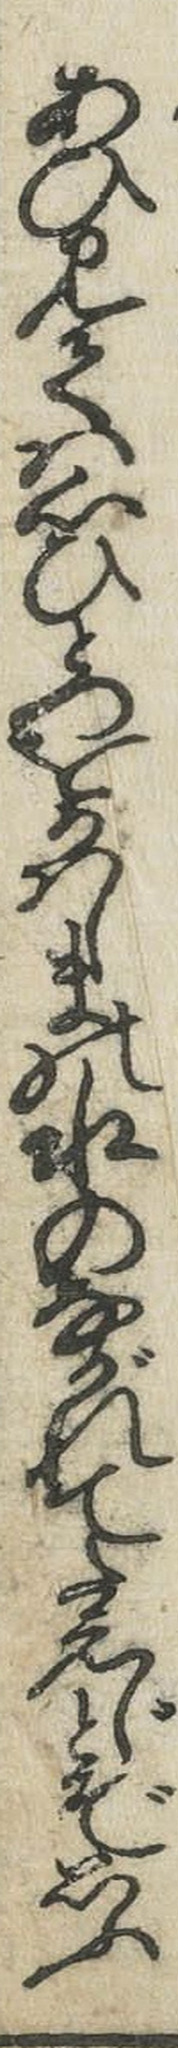あひ見ては心ひとつをかはしまの水のながれてたえじとぞ思ふ
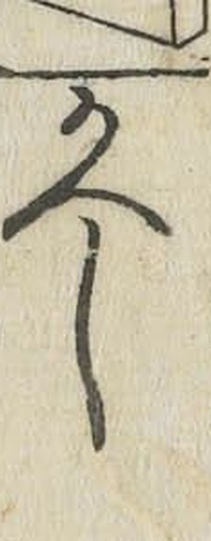かへし
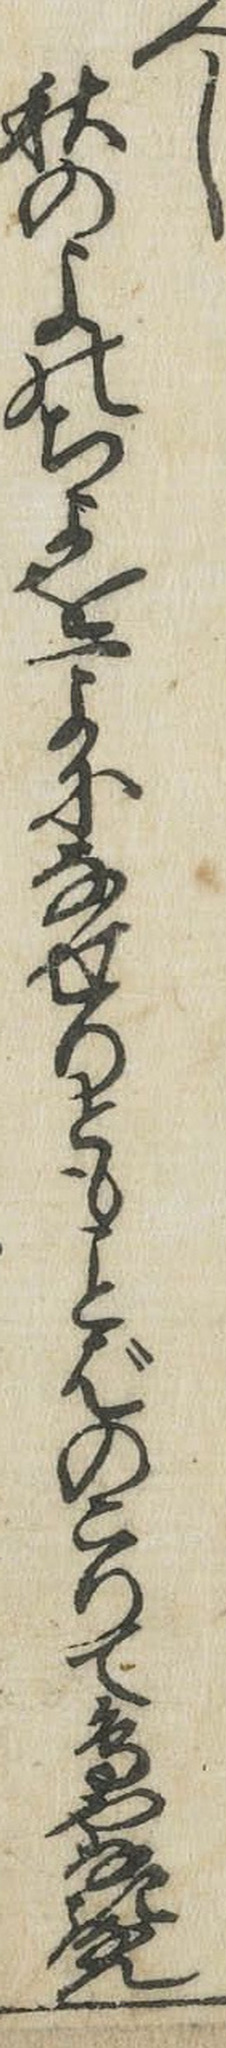秋のよのちよを一よになせりともことばのこりて鳥やなきなん
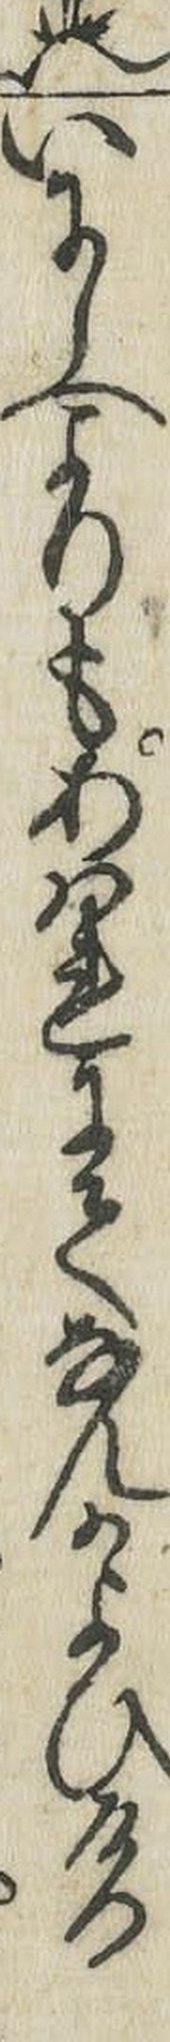いにしへよりも。あはれにてなんかよひける
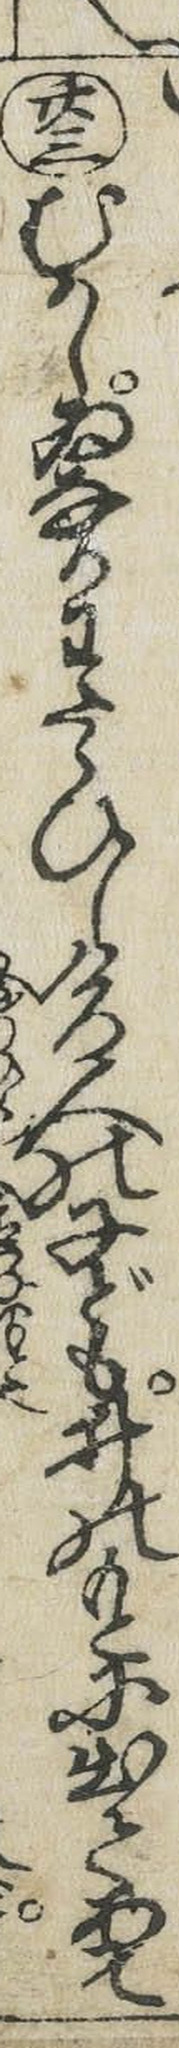(廿三)むかし。ゐなかわたらひしける人の子ども。井のもとに出てあそ
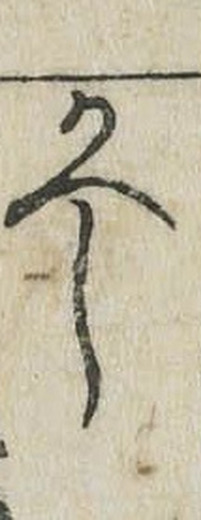かへし

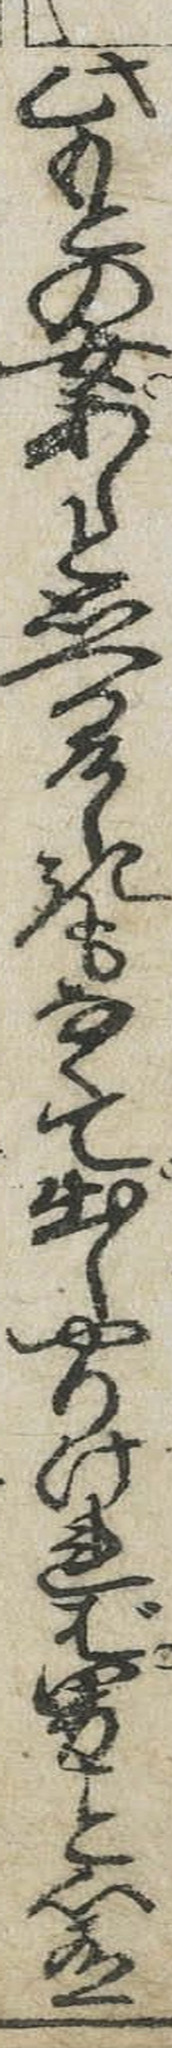此もとの女。あしと思へるけしきもなくて。出しやりければ。男こと心有
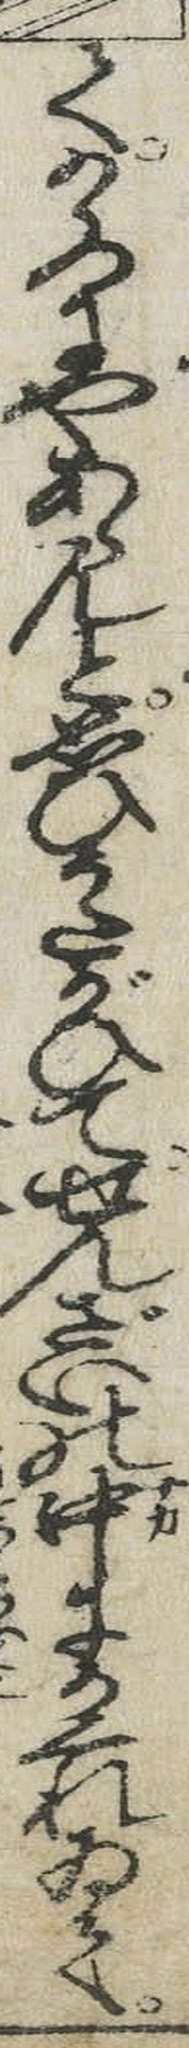て。かゝるにやあらんと。思ひうたがひて。せんざいの中にかくれゐて。
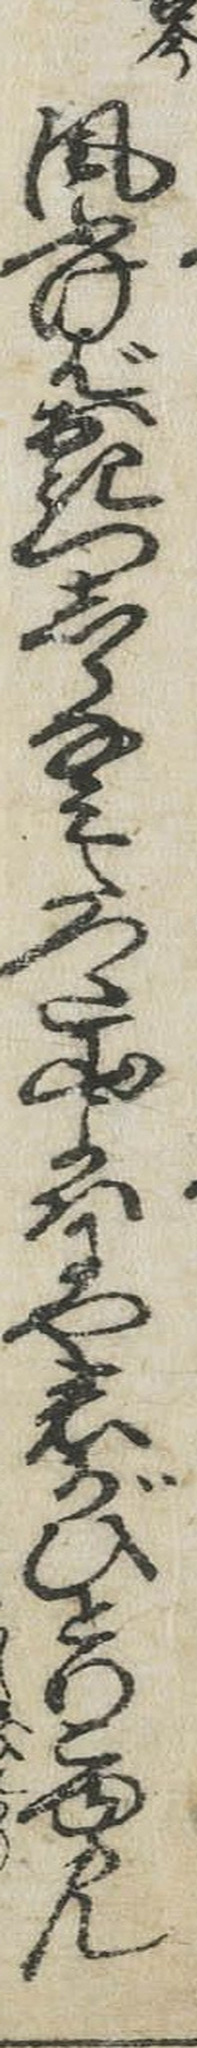古今風ふけばおきつしらなみたつた山よはにや君がひとりこゆらん
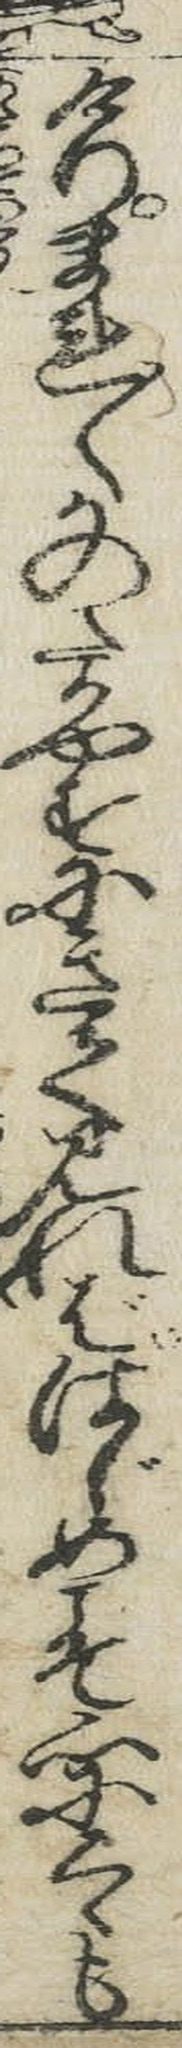けり。まれ〳〵かのたかやすにきて見れば。はじめこそ心にくゝも
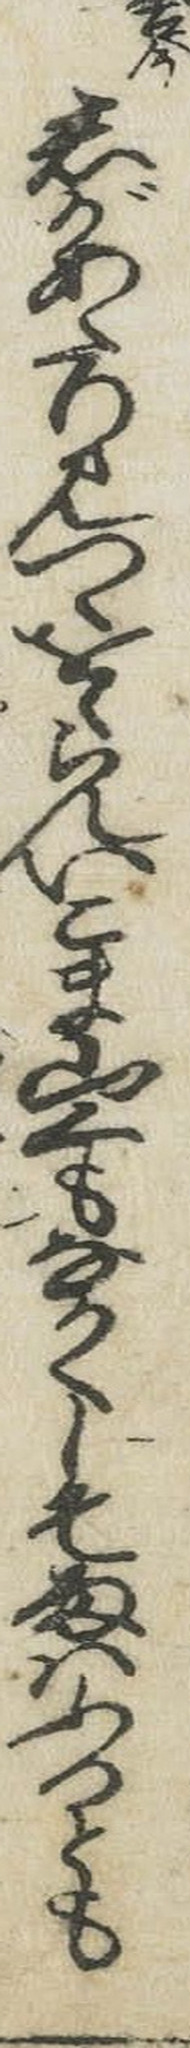新古今君があたり見つゝをゝらんいこま山くもなかくしそ雨はふるとも
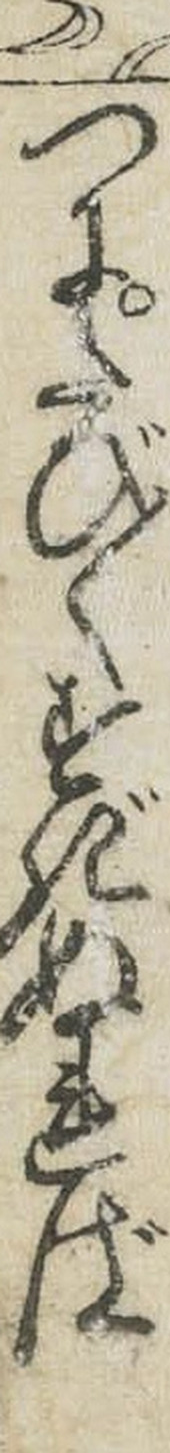つに。たび〳〵すぎぬれば
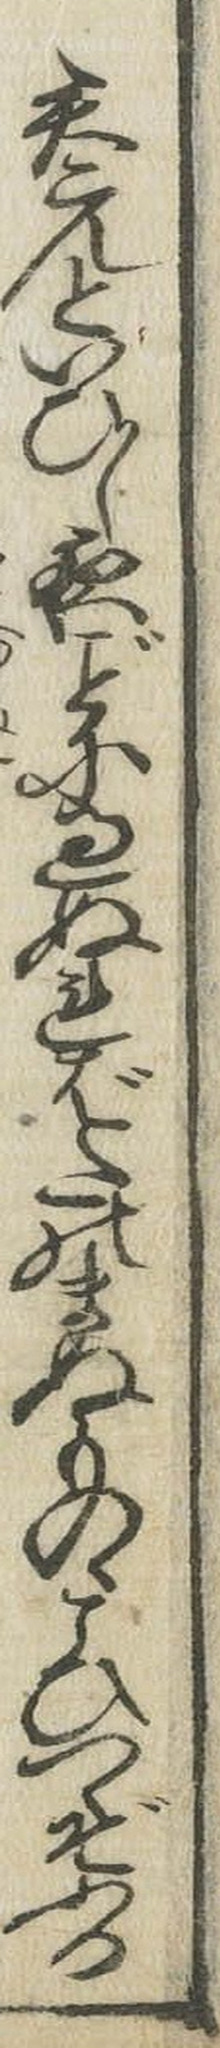君こんといひし夜ごとに過ぬればたのまぬものゝこひつゝぞふる
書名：新板絵入伊勢物語 : かうしやく付 2巻 上
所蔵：東京学芸大学教育コンテンツアーカイブ
